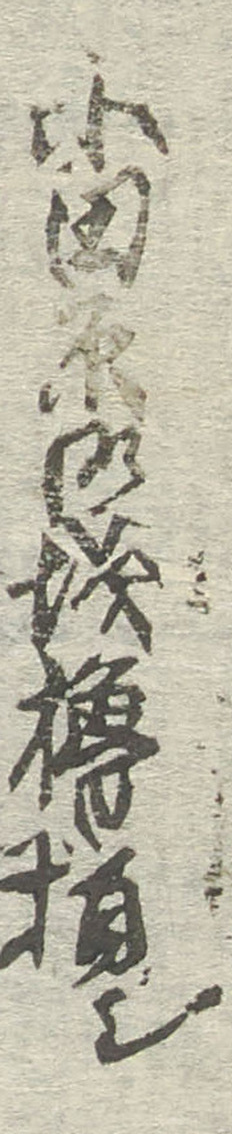小田原御城櫓損じ
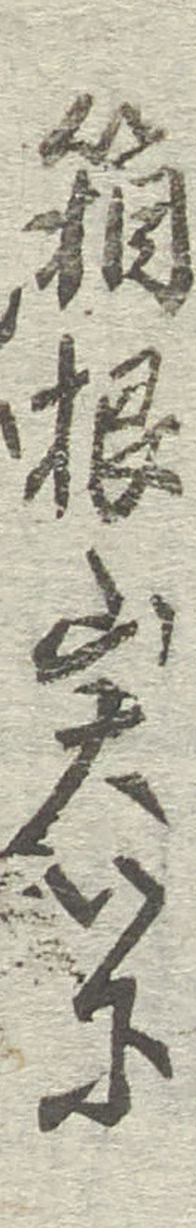箱根山大いに
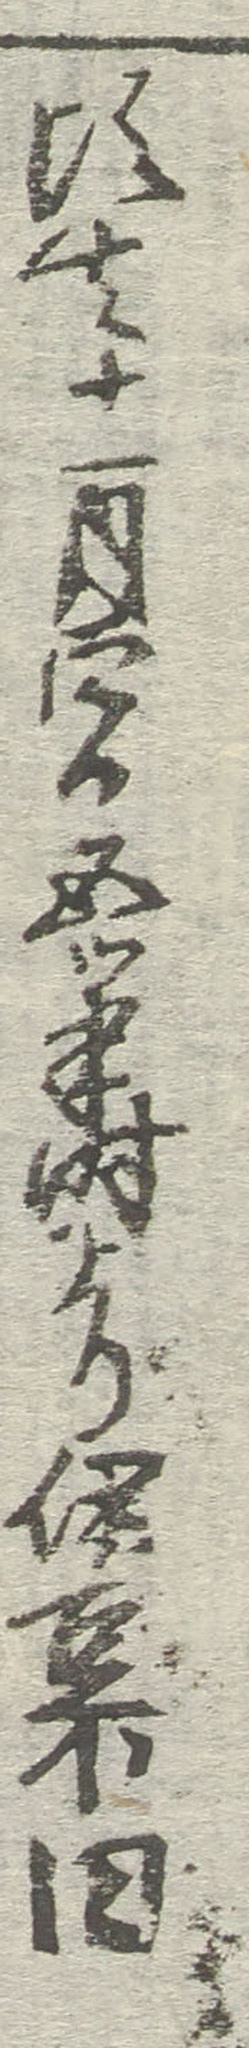頃は十一月四日五つ半時より伊豆下田
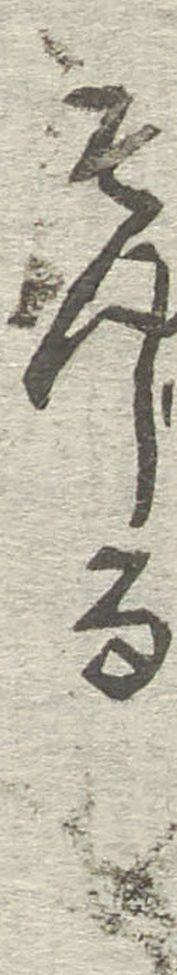そんじる
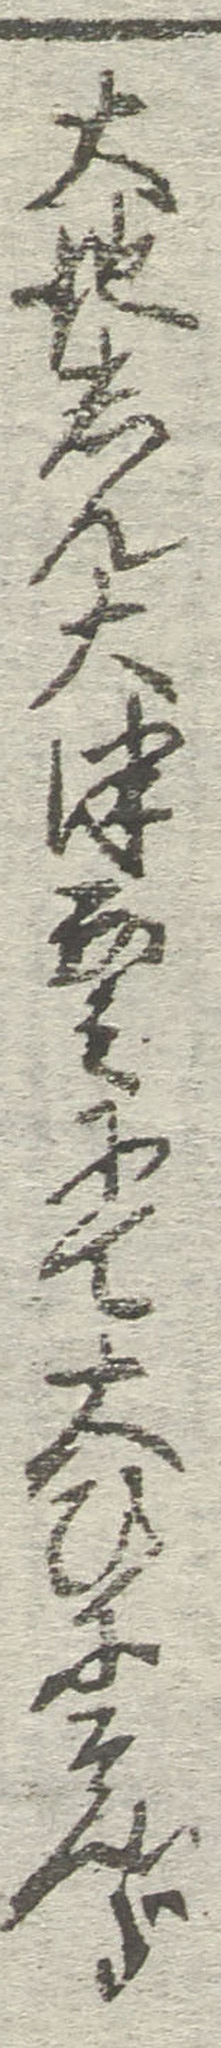大地しん大津なみにて大ひにそんじ
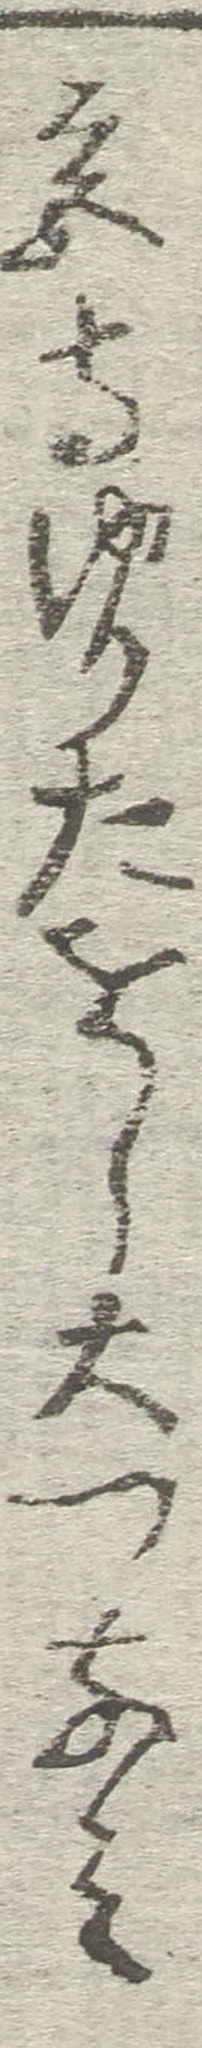宮寺ゆりたをし大つなみ
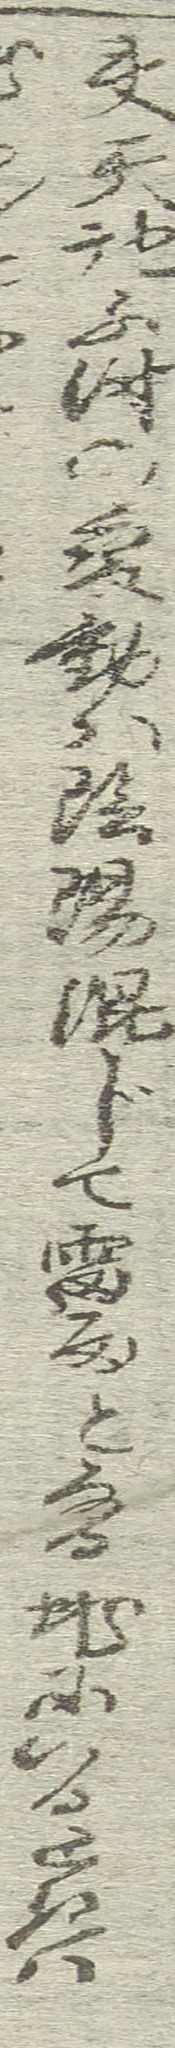夫天地不時の震動は陰陽混じて雷雨となる地にいるときは
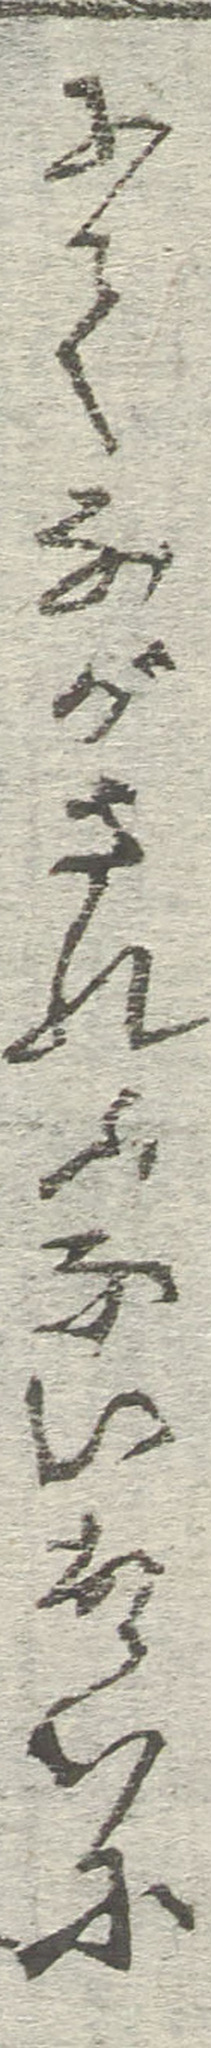にてながされふないおゝいに
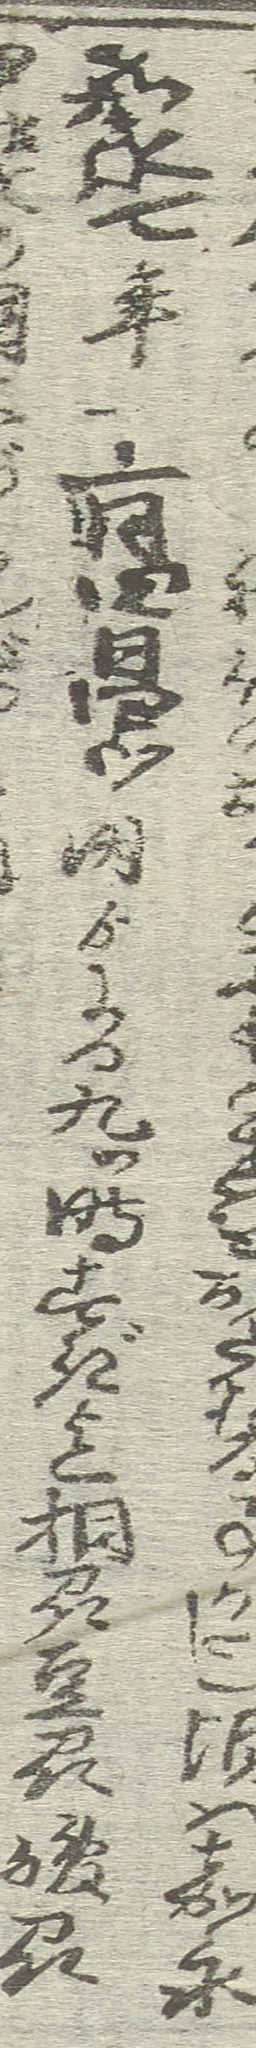嘉永七年十一月四日四つ時よりよる九つ時すぎ迄相州豆州駿州
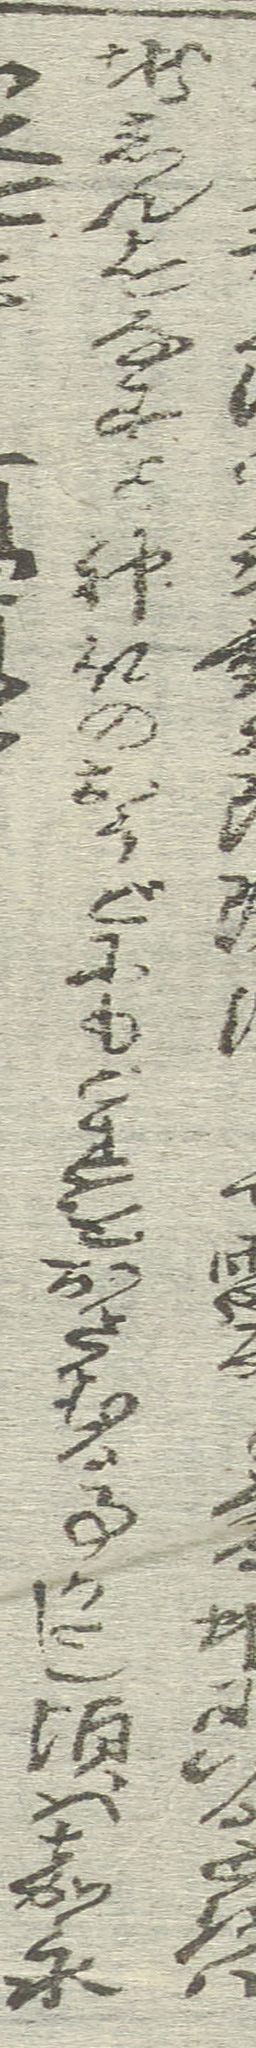地しんをなす神きのおうごにもこれをおさむる事かたし頃は嘉永
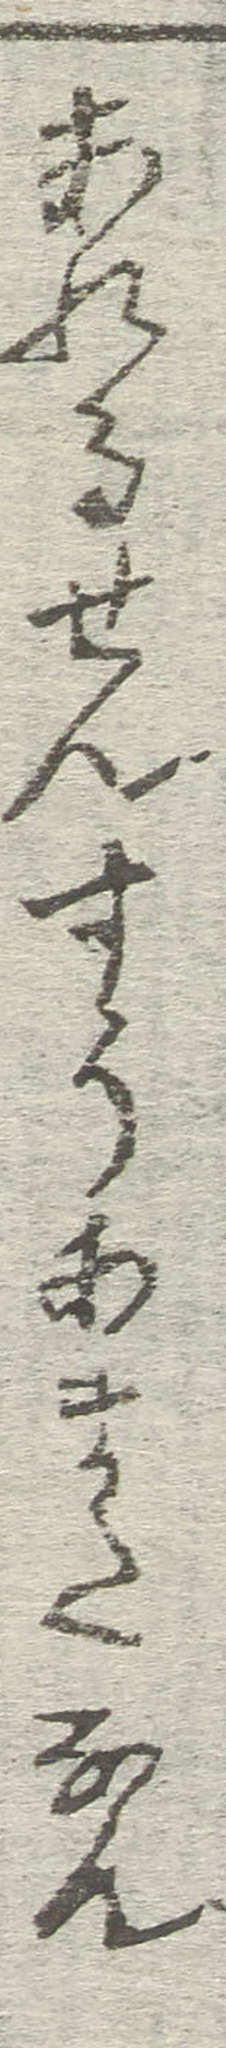あれるせんすうあまたなん
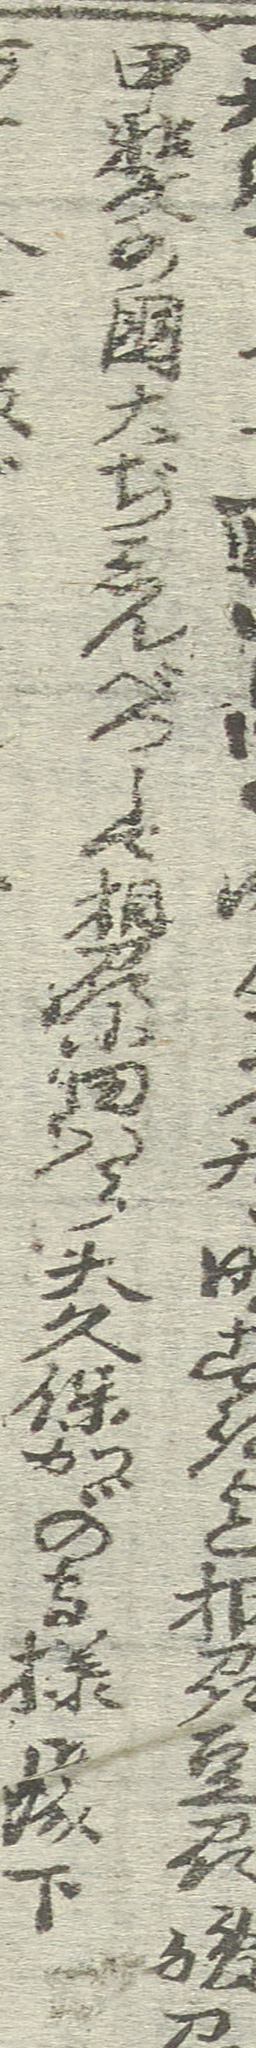甲斐の国大ぢしんべつして相州小田はら大久保加ゞの守様御城下
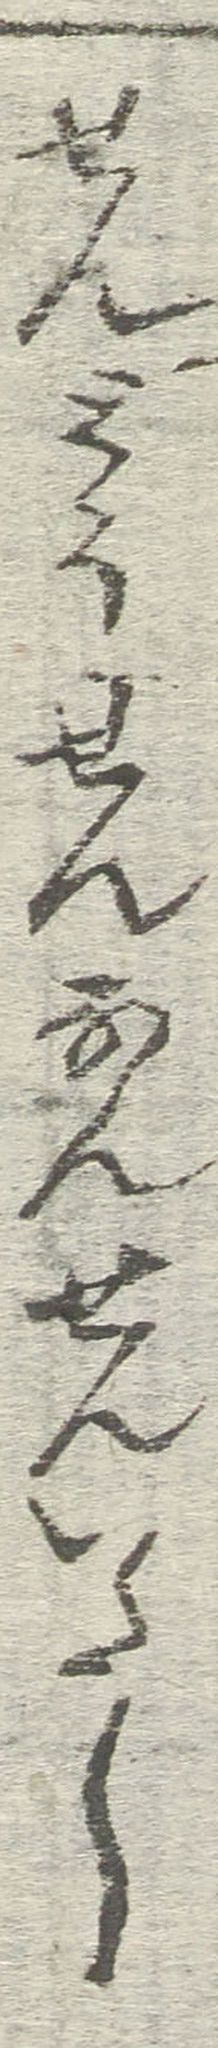せんとうせんなんせんいたし
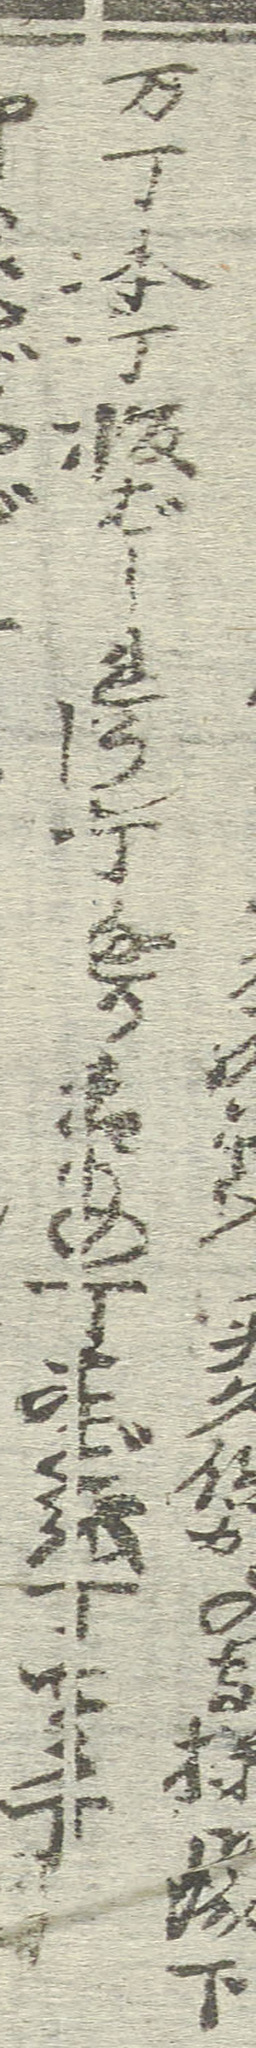万丁本丁板ばしれうし丁通り青もの丁すどを丁はら丁
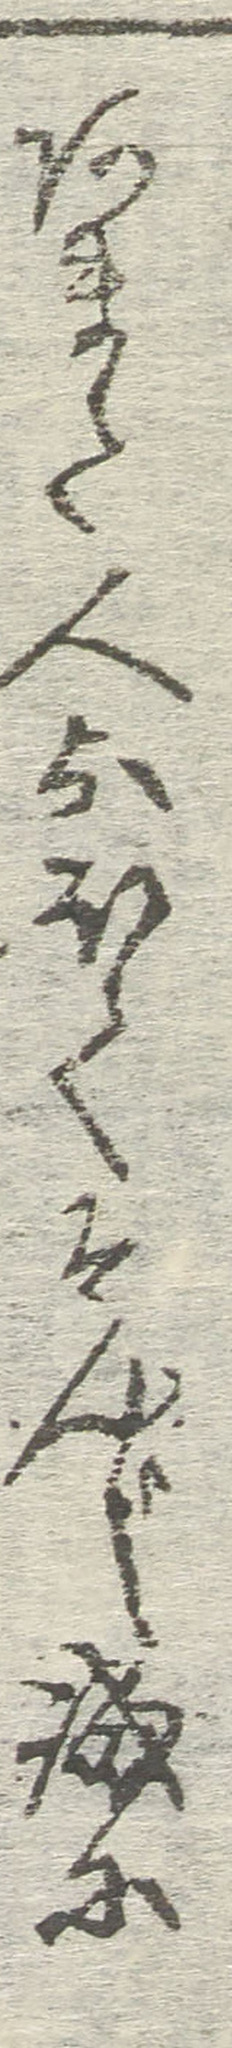あまた人おほくそんじ誠に
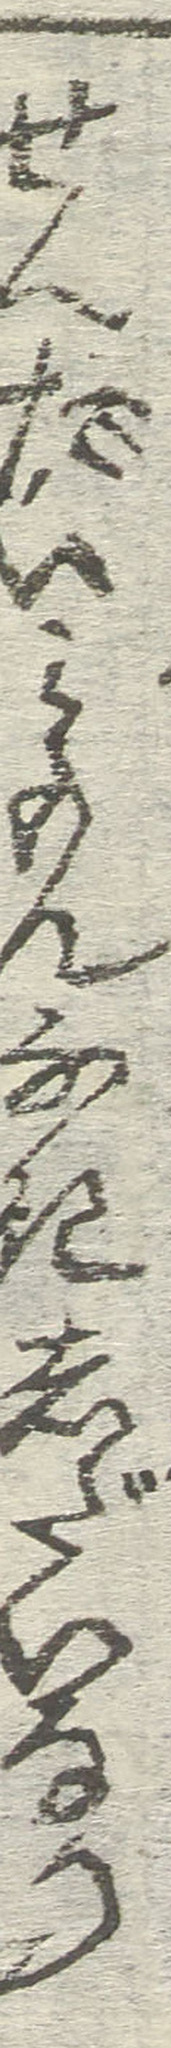せんたいみもんなきしだいなり
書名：伊豆下田小田原箱根大地震之図
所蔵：東京大学総合図書館 General Library in the University of Tokyo, JAPAN
